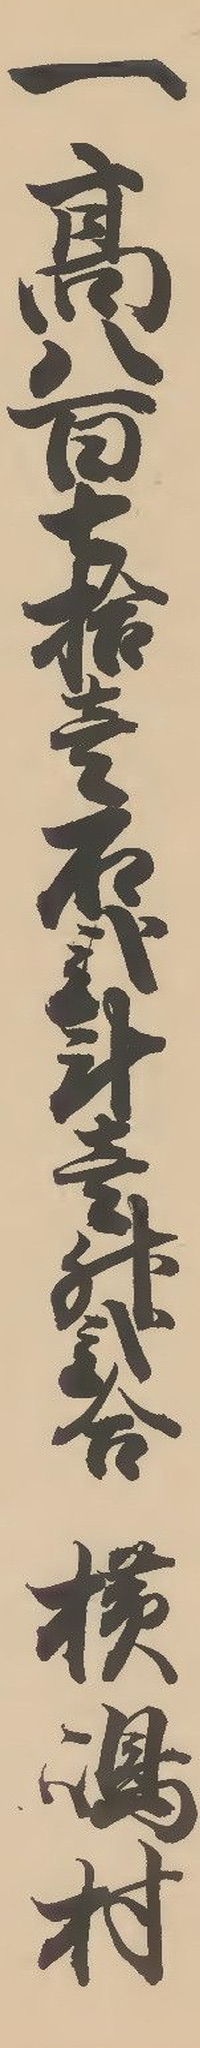一髙八百七拾壱石弐斗壱升弐合横嶋村
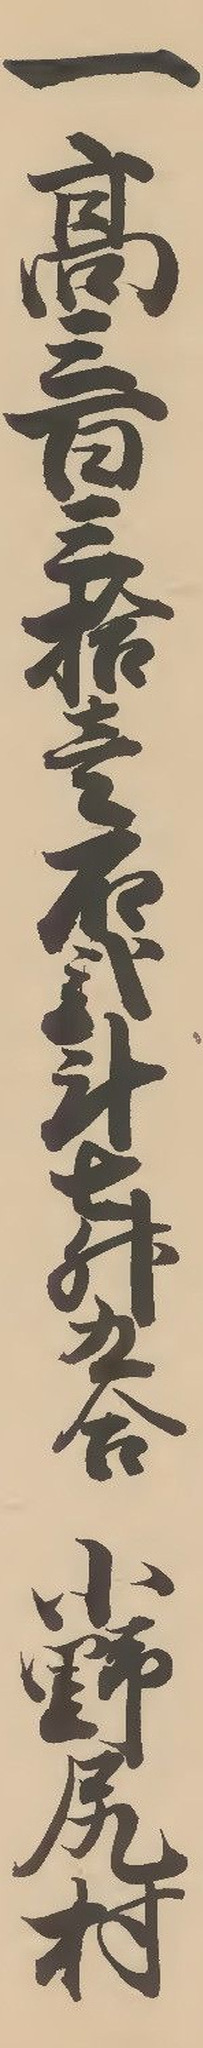一髙三百三拾壱石弐七升九合小野尻村
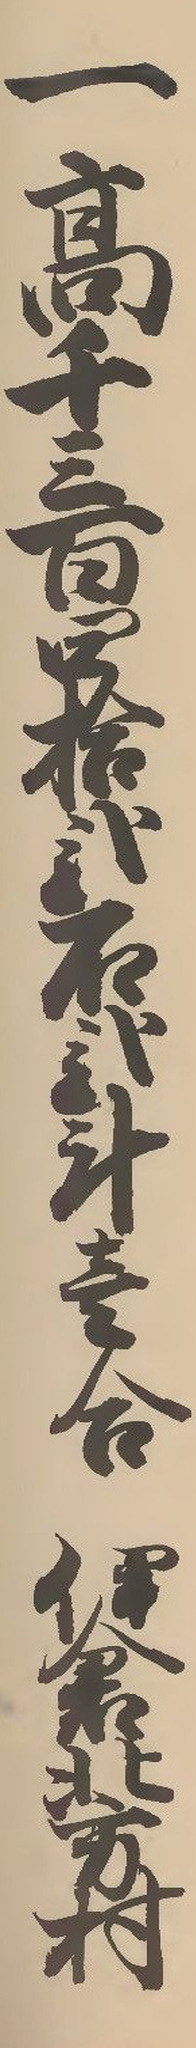一髙千三百四拾弐石弐斗壱合伊倉北方村
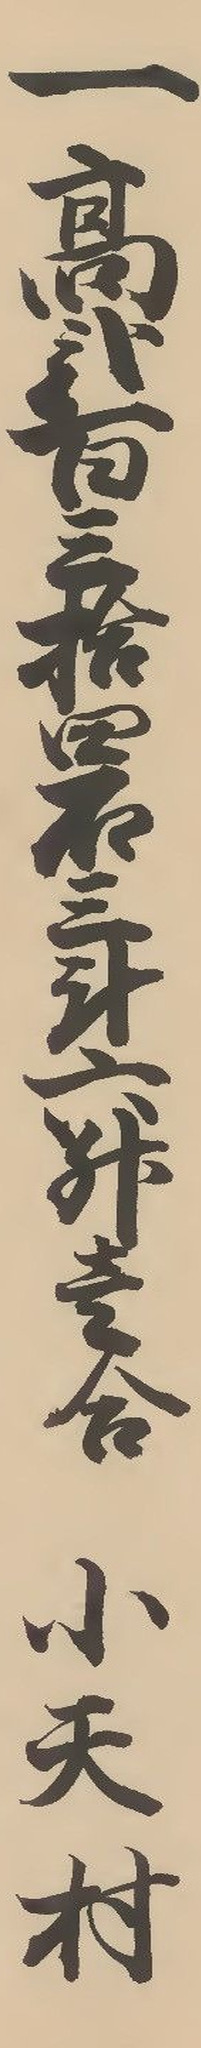一髙弐百三拾四石三斗六升壱合小天村
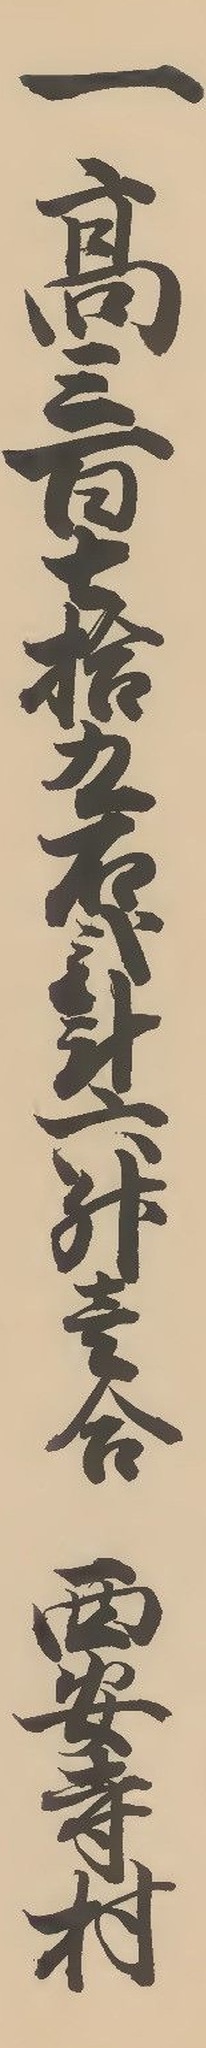一髙三百七拾九石弐斗六升壱合西安寺村
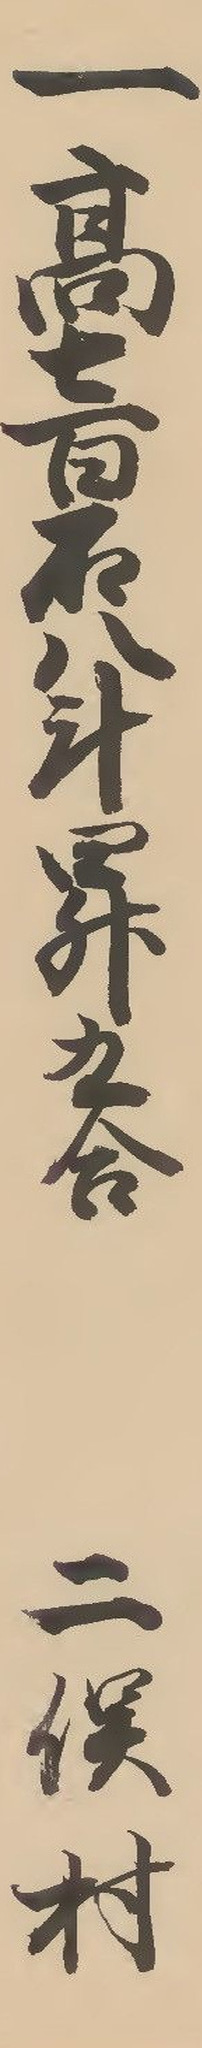一髙七百石八斗四升九合二俣村

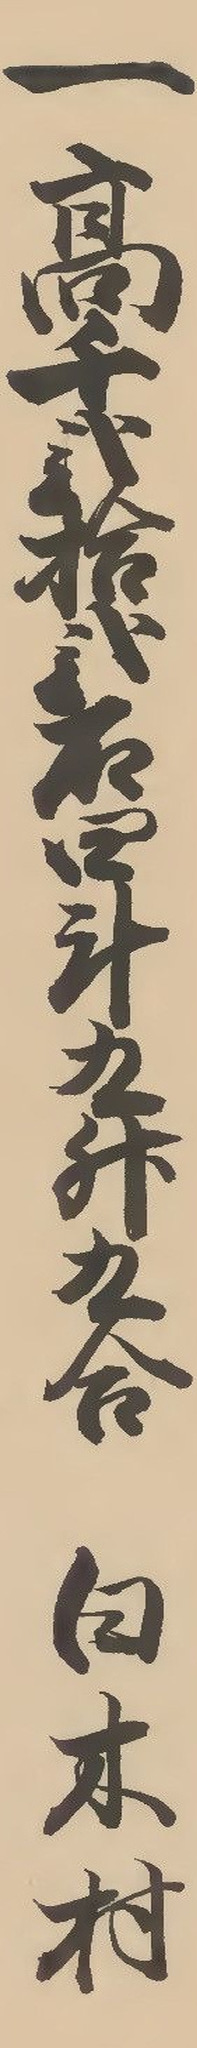一髙千弐拾弐石四斗九升九合白木村
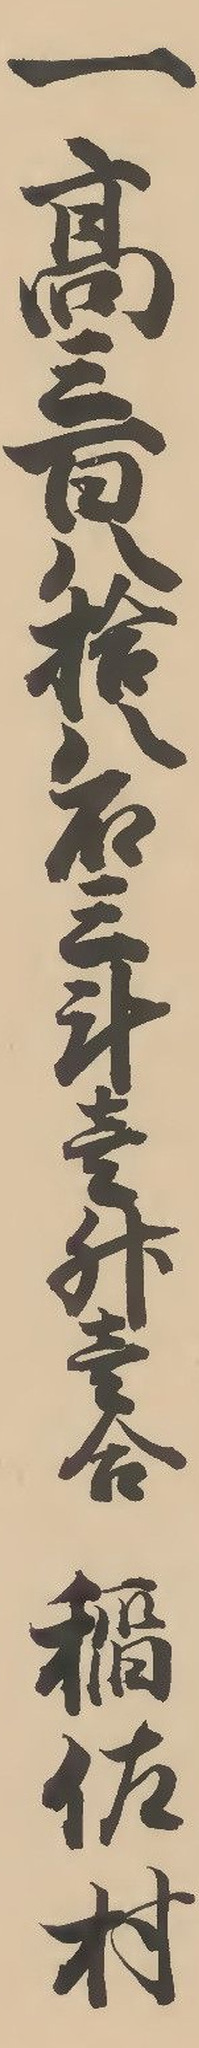一髙三百八拾八石三斗壱升壱合稲佐村
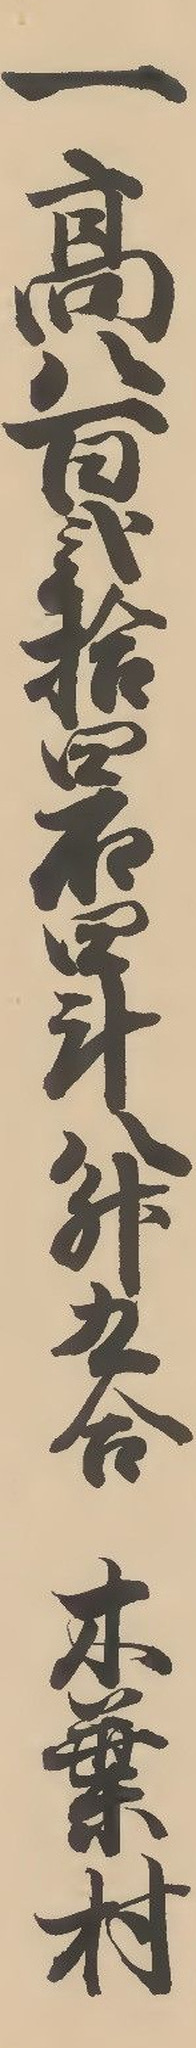一髙八百弐拾四石四斗八升九合木葉村
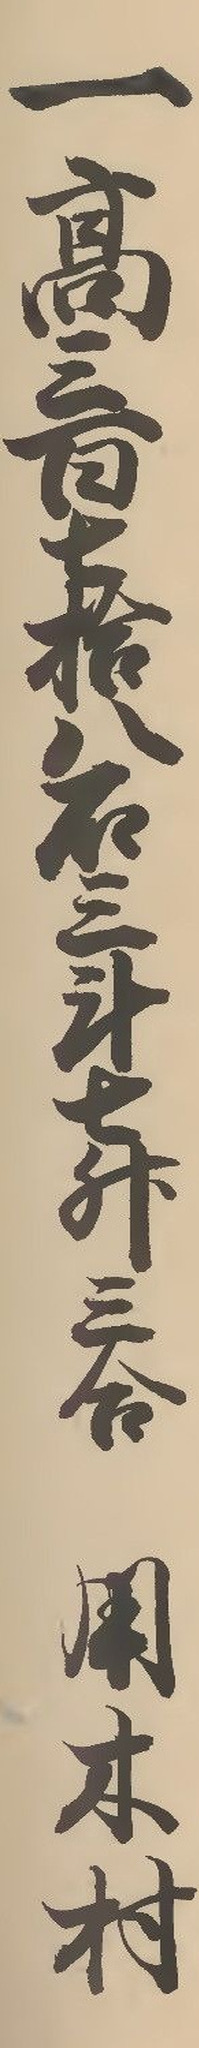一髙三百七拾八石三斗七升三合用木村
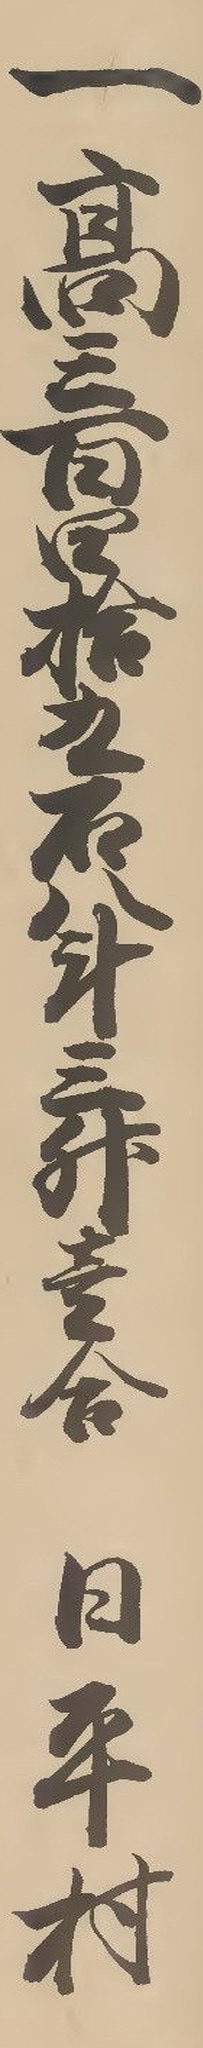一髙三百四拾九石八斗三升壱合日平村
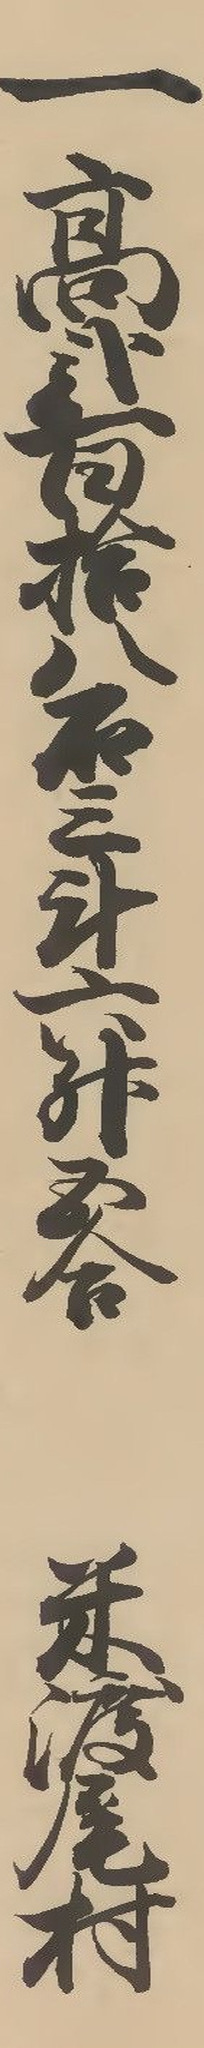一髙弐百拾八石三斗六升五合米渡尾村
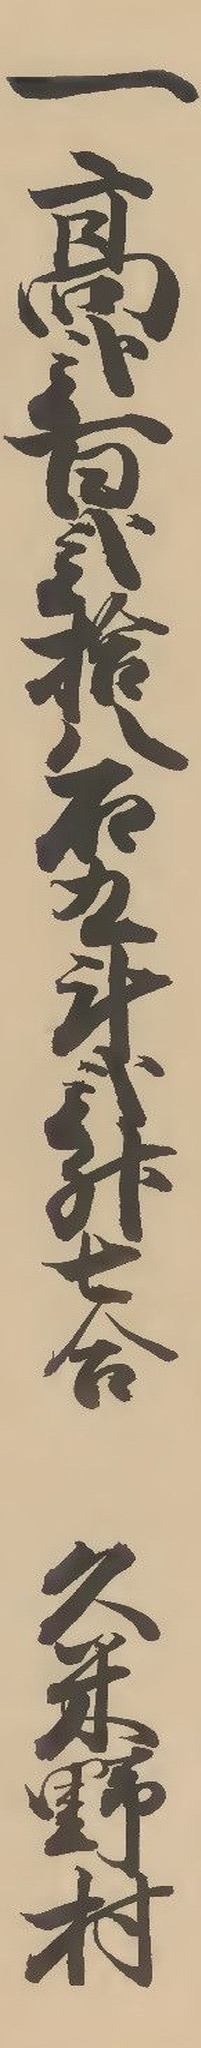一髙弐百弐拾八石九斗に弐升七合久米野村
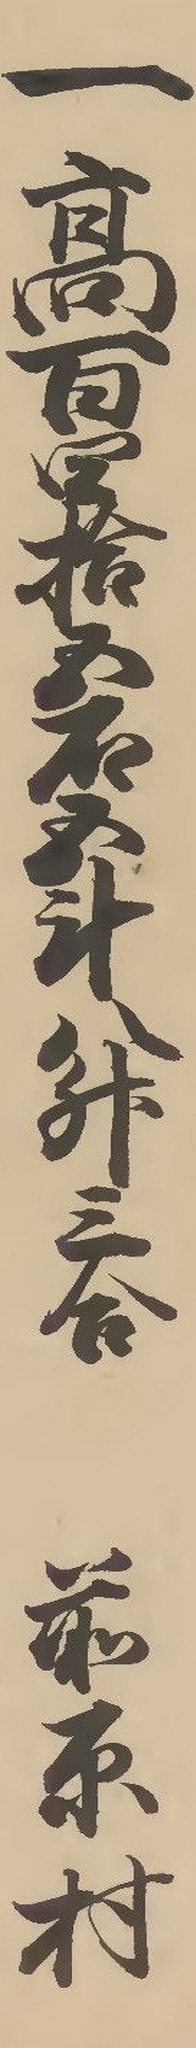一髙百四拾五石五斗八升三合前原村

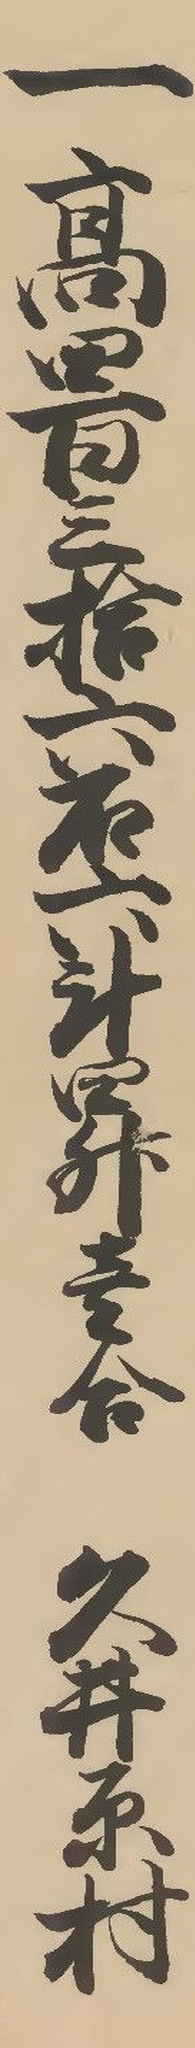一髙四百三拾六石六斗四升壱合久井原村
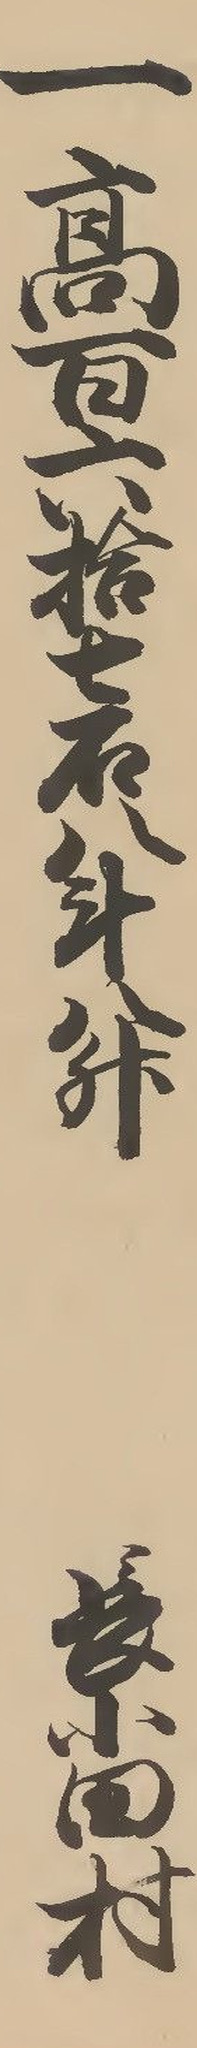一髙百六拾七石八斗八升長小田村
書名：肥後国郷帳
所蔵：国立公文書館 National Archives of Japan
